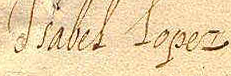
Isabel Lopez
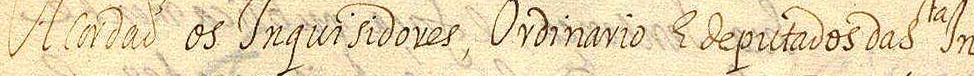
Acordaõ os Inquisidores, Ordinario E deputados da sta In
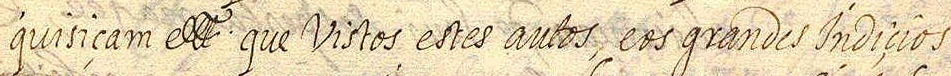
quisiçam etc. que vistos estes autos, e os grandes Indicios
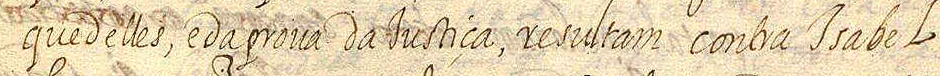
que delles, e da proua da Iustiça, resultam contra IsabeL
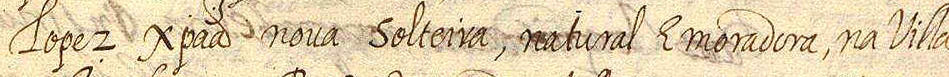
Lopez xpāa noua solteira, natural E moradora, na Villa
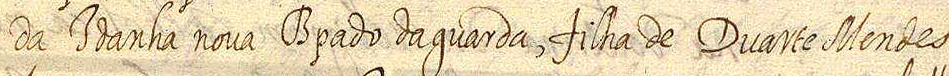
da Idanha noua Bpado da guarda, filha de Duarte Mendes
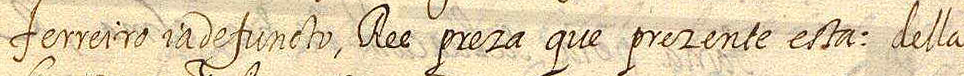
ferreiro ia defuncto, Ree preza que prezente esta: della
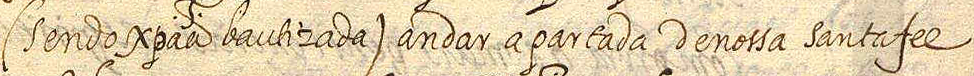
(sendo xpāa bautizada) andar apartada de nossa santa fee
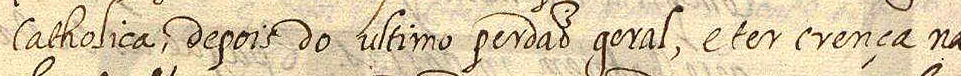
catholica, depois do ultimo perdaõ geral, e ter crença na
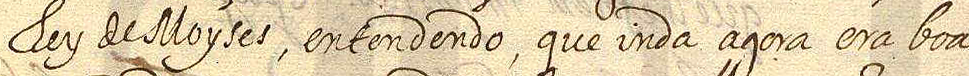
Ley de Moyses, entendendo, que inda agora era boa
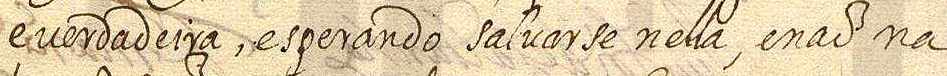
e uerdadeira, esperando saluarse nella, e naõ na
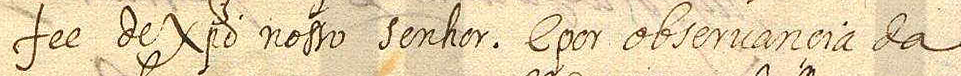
fee de Xp̄o nosso senhor. e por obseruancia da
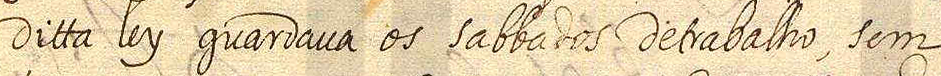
ditta ley guardaua os sabbados de trabalho, sem
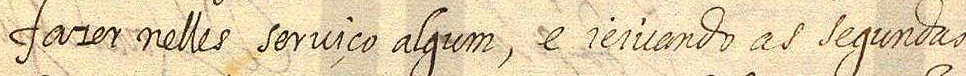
fazer nelles seruiço algum, e ieiuando as segundas
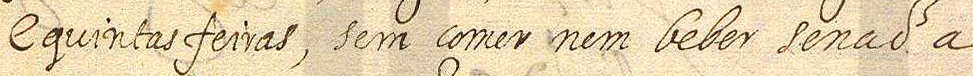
e quintas feiras, sem comer nem beber senaõ a
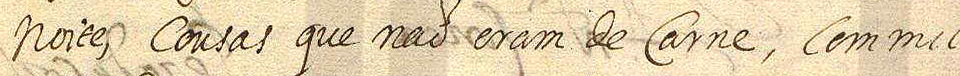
noite, cousas que naõ eram de Carne, Commu
